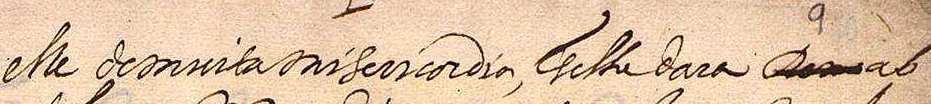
elle de muita misericordia se lhe dara Dom ab
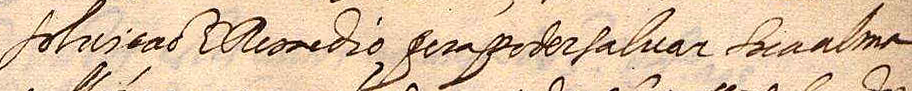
soluiçaõ E Remedio, pera poder saluar sua alma
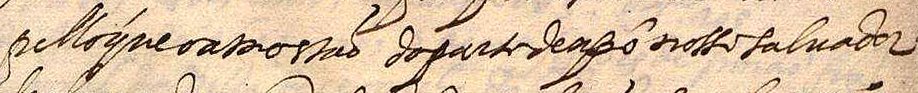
pello que o amoestaõ da parte de xpō nosso saluador
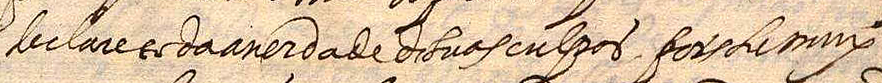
declare toda a uerdade de suas culpas pois he muy
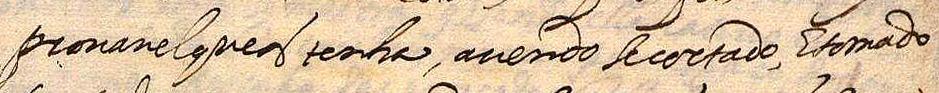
prouauel que as tenha, auendo se cortado, E tomado
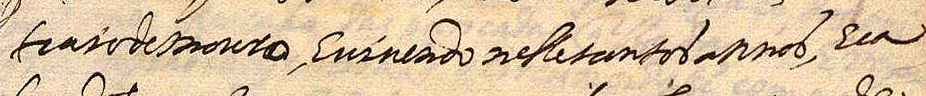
traio de mouro, E uiuendo nelle tantos annos, E ca
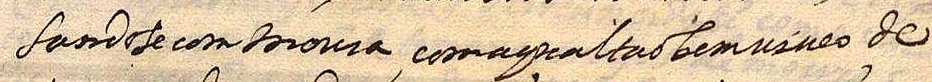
sandose com moura, com a qual taõbem uiueo de
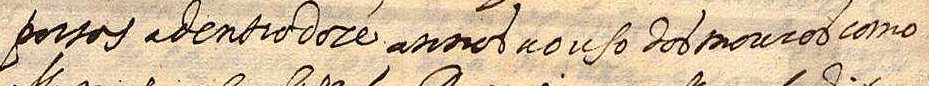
portas adentro doze annos ao uso dos mouros como
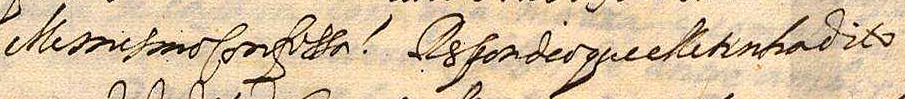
elle mesmo Confessa? Respondeo que elle tinha dito
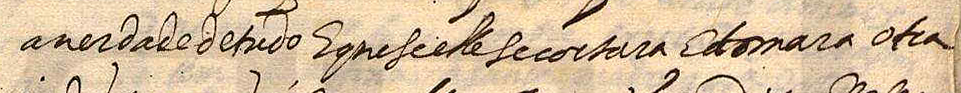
a uerdade de tudo E que se elle se cortara E tomara o tra
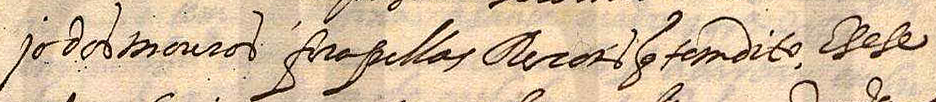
jo dos mouros fora pellas Rezois q̄ tem dito, E se se
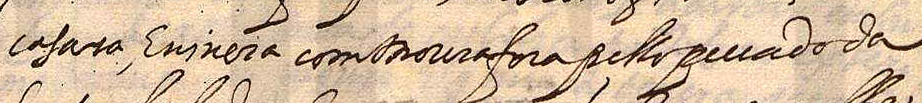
casara, E uiuera com moura fora pello peccado da
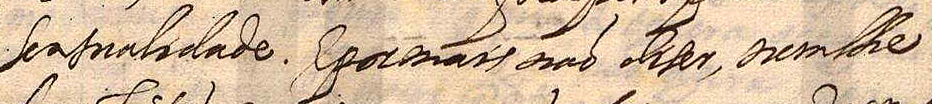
sensualidade. E por mais naõ diser, nom lhe
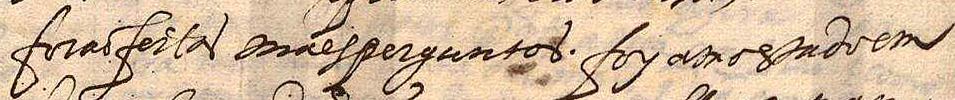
foraõ feitas maes perguntas. foy amoestado em
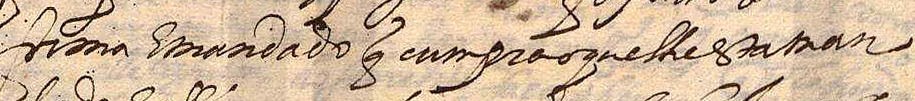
forma E mandado q̄ cumpra o que lhe esta man
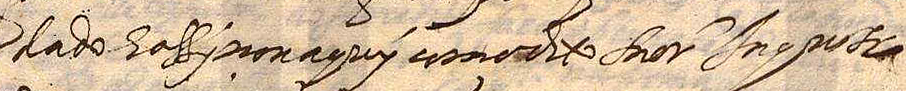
dado, E assynou aquy com o dito Snor̄ Inquisi
